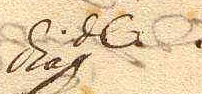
dia gde
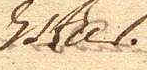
Esther.
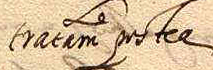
tratamto postea
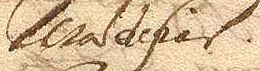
Rezaõ de fiar.
